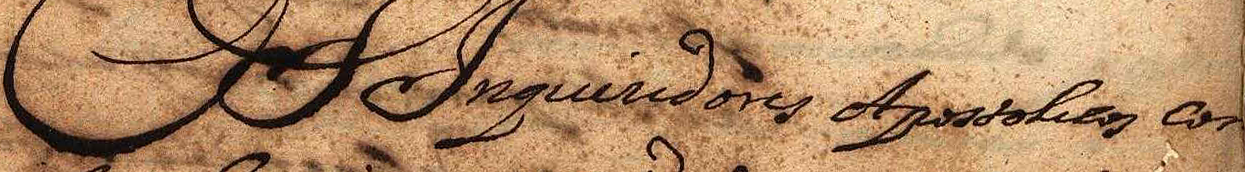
OS Jnquizidores Apostolicos con
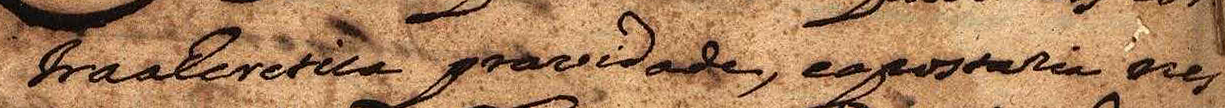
tra a heretica pravidade, e apostazia nes
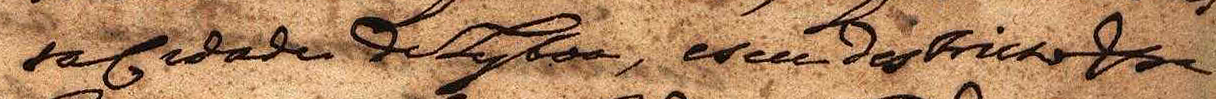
ta Cidade de Lisboa, e seu destricto &a
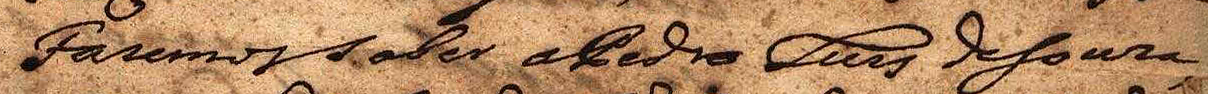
Fazemos saber a Pedro Luis de souza,
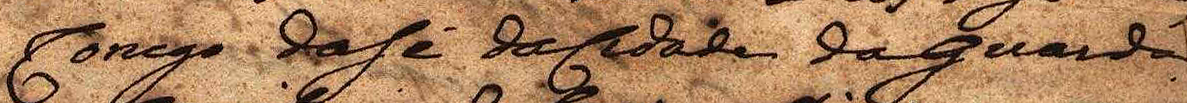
Conego da sé da Cidade da Guarda
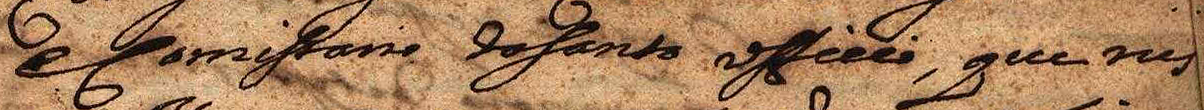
e Comissario da santo officio, que nes
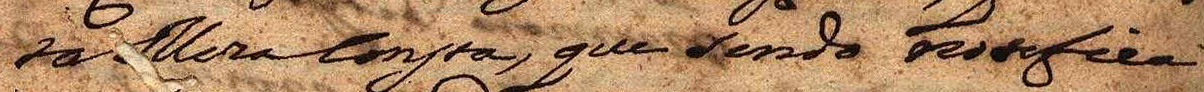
ta Meza Consta, que sendo notefica
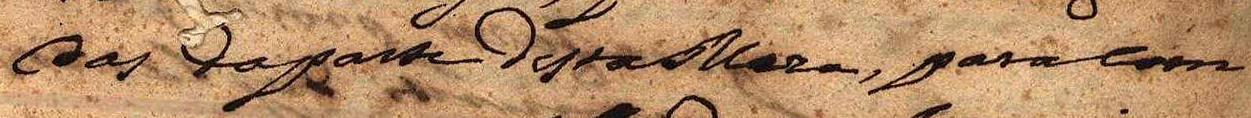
das da parte desta Meza, para com
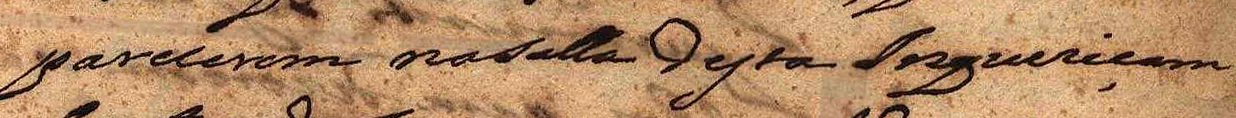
parecerem na salla desta Inqueziçam
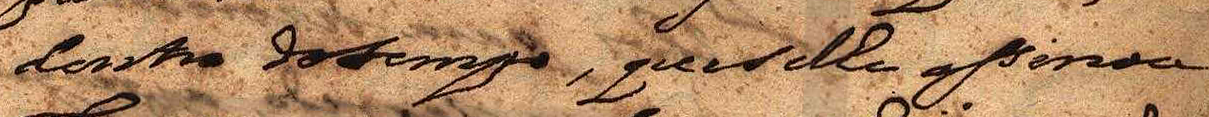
dentro do tempo, que se lhe assinou
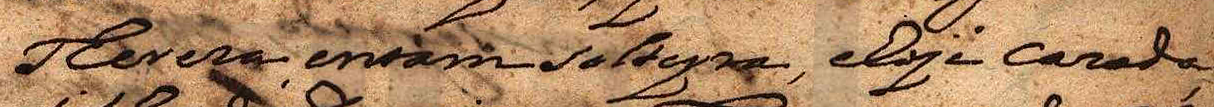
Thereza, entam solteyra, e hoje cazada,
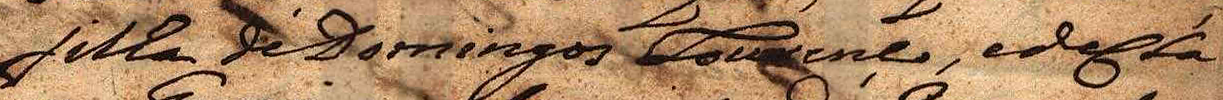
filha de Domingos Lourenço, e de Cla
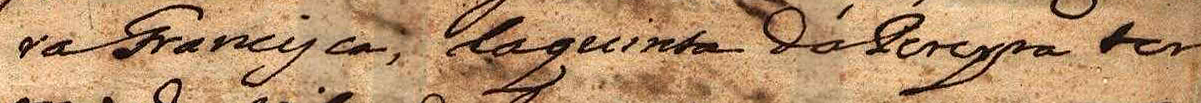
ra Francisca, da quinta da Pereya ter
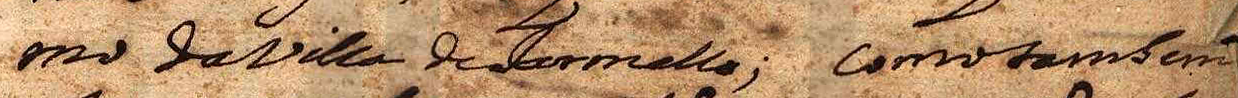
mo da villa de Iermello; como tambem
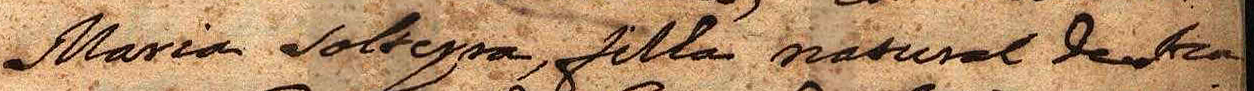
Maria solteyra, filha natural de Iza
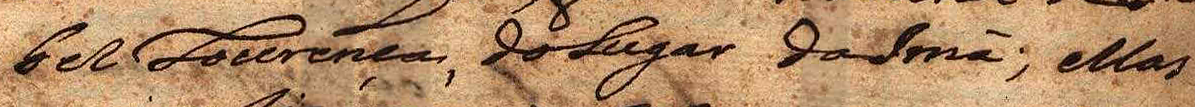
bel Lourença, do Lugar da Imã; ellas
